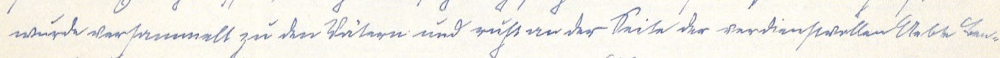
wurde versammelt zu den Vätern und ruht an der Seite der verdienstvollen Äbte Lau-
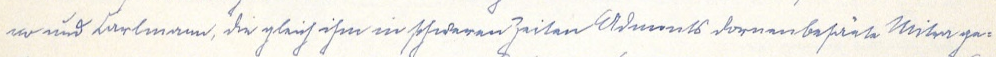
ro und Carlamann, die gleich ihm in schweren Zeiten Admonts dornenbesäte Mitra ge-
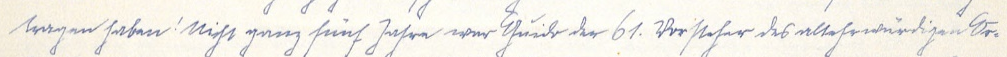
tragen haben! Nicht ganz fünf Jahre war Guido der 61. Vorsteher des altehrwürdigen Er
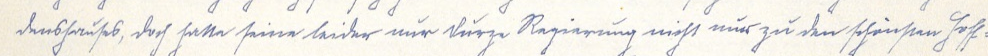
denshauses, doch hatte seine leider nur kurze Regierung nicht nur zu den schönsten Hoff-
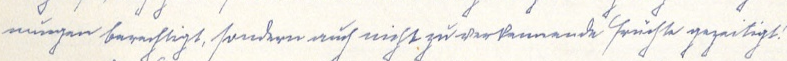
nungen berechtigt, sondern auch nicht zu verkennende Früchte gezeitigt!
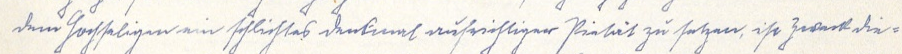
Dem hochseligen ein schlichtes Denkmal aufrichtiger Pietät zu setzen, ist zweck die-
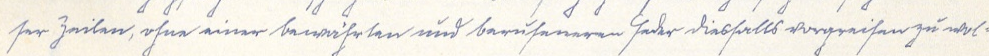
ser Zeilen, ohne einer bewährten und berufeneren Feder diesfalls vorgreifen zu wol-
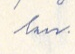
len.
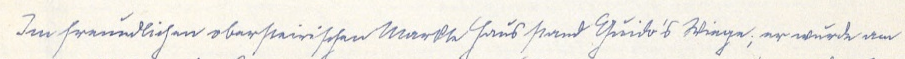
Im freündlichen obersteirischen Markte Haus stand Guido's Wiege; er wurde am
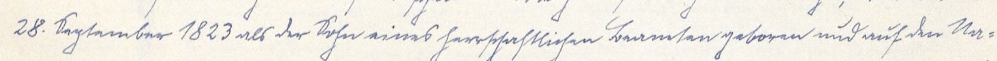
28. September 1823 als der Sohn eines herrchaftlichen Beamten geboren und auf den Na-
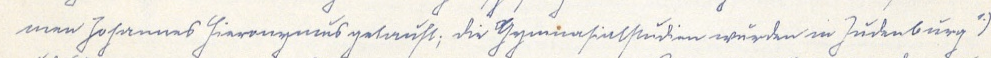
men Johannes Hieronymus getauft; die Gymnasialstudien wurden in Judenburg 1.)
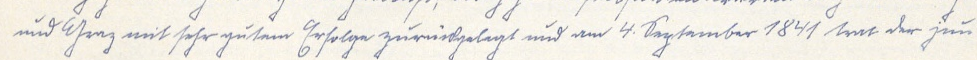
und Graz mit sehr gutem Erfolge zurückgelegt und am 4. September 1841 war der jun-
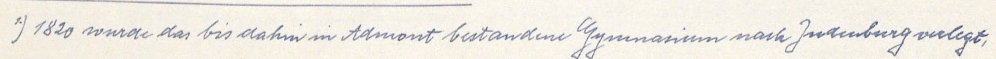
1.) 1820 wurde das bis dahin in Admont bestandene Gymnasium nach Judenburg verlegt,
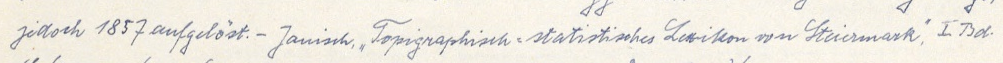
jedoch 1857 aufgelöst. - Janisch,"Topigraphisch-statistisches Lexikon von Steiermark", I. Bd.
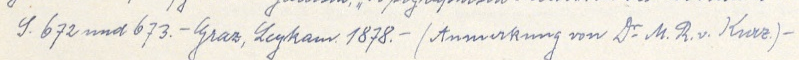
S. 672 und 673. - Graz, Leykam. 1878 - (Anmerkung von Dr M. R. v. Karz.) -
